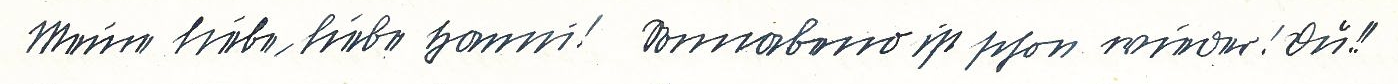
Meine liebe, liebe ! Sonnabend ist schon wieder! Du!!
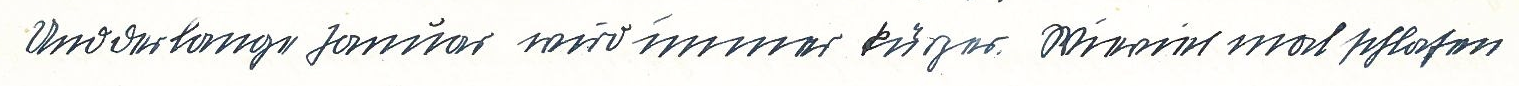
Und der lange Januar wird immer kürzer. Wie viel mal schlafen
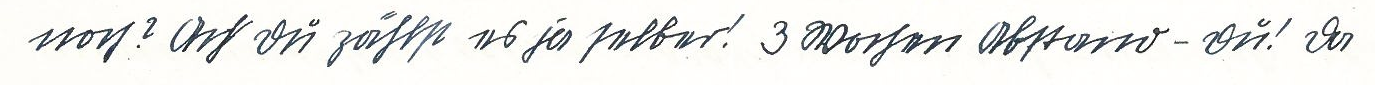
noch? Ach Du zählst es ja selber! 3 Wochen Abstand – Du! Da
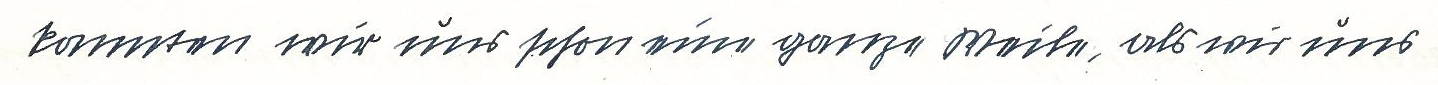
kannten wir uns schon eine ganze Weile, als wir uns
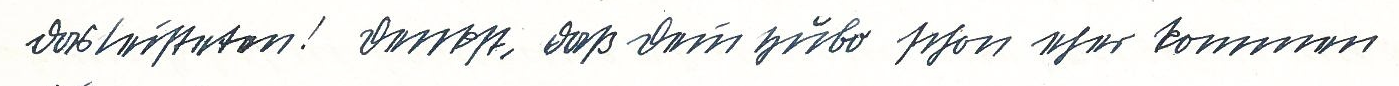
das leisteten! Denkst, daß Dein Hubo schon eher kommen
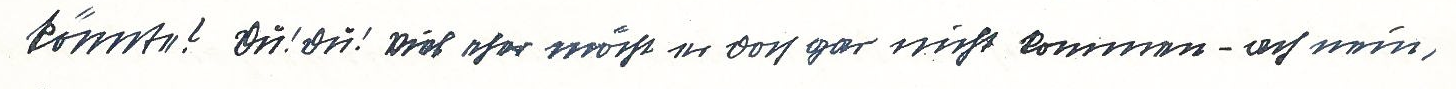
könnte? Du! Du! Viel eher möcht er doch gar nicht kommen – ach nein,
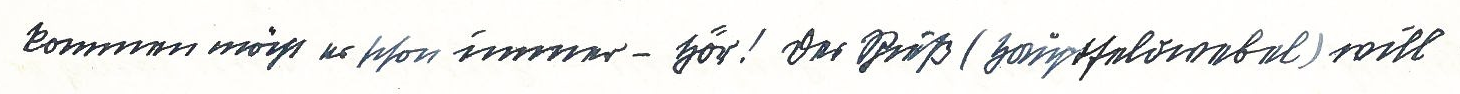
kommen möcht er schon immer – Hör! Der Spieß (Hauptfeldwebel) will
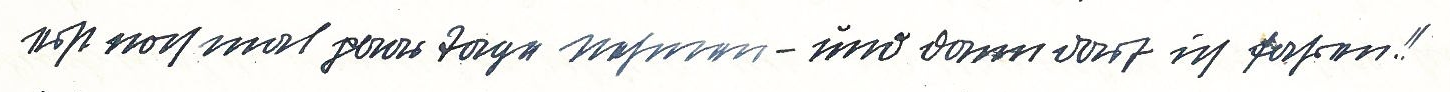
erst noch mal paar Tage nehmen – und dann darf ich fahren!!
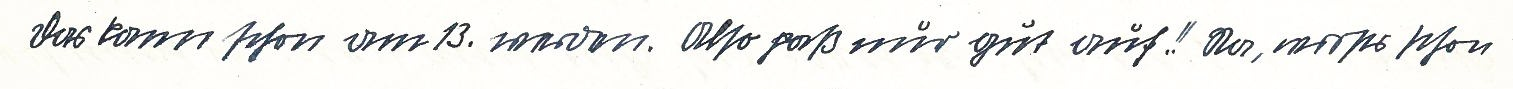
Das kann schon am 13. werden. Also paß nur gut auf!! Na, wirsts schon
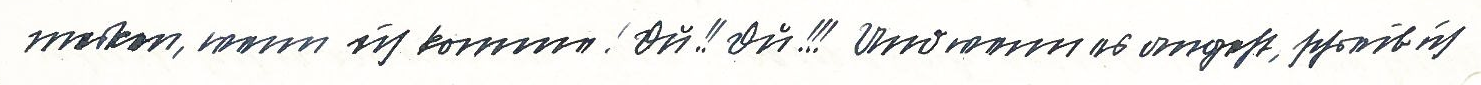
merken, wenn ich komme! Du!! Du!!! Und wenn es angeht, schreib ich
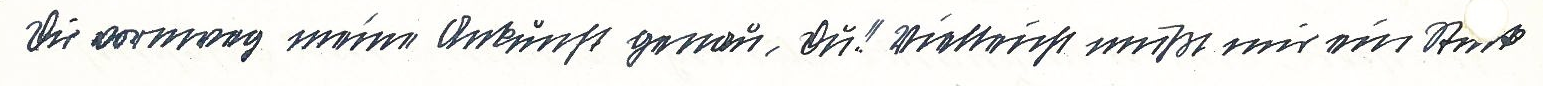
Dir vornweg meine Ankunft genau, Du!! Vielleicht mußt mir ein Stück
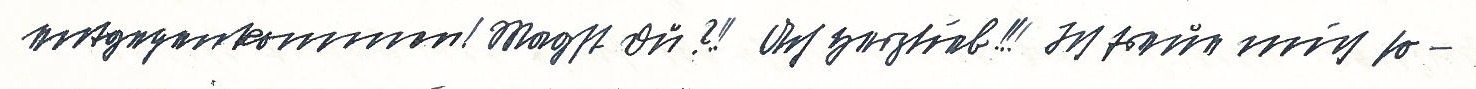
entgegen kommen! Magst Du?!! Ach Herzlieb!!! Ich freue mich so –
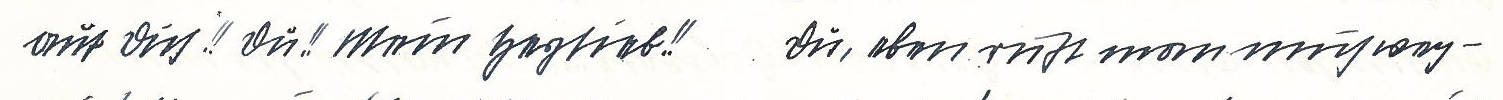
auf Dich!! Du!! Mein Herzlieb!! Du, eben ruft man mich weg –
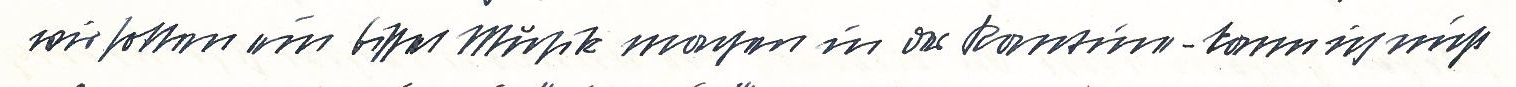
wir sollen ein bissel Musik machen in der Kantine – kann ich nicht
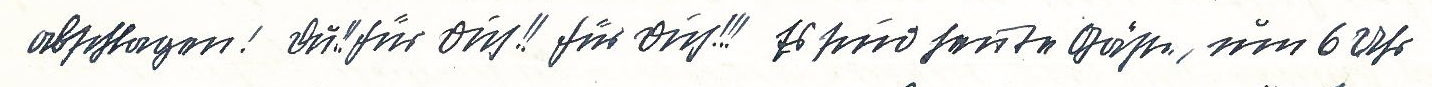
abschlagen! Du!! für Dich!! für Dich!!! Es sind heute Gäste, um 6 Uhr
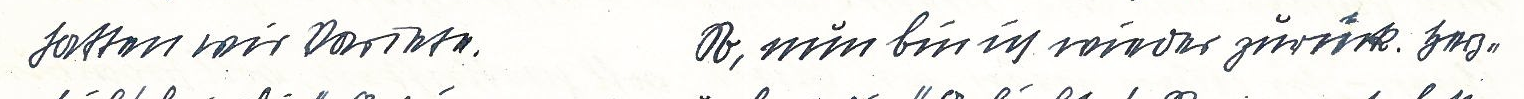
hatten wir Variete. So, nun bin ich wieder zurück. Herz¬
